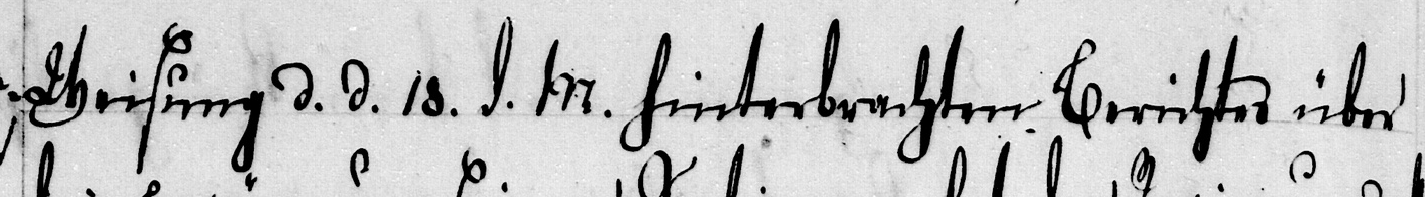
Weisung d. d. 18. d. M. hinterbrachten Berichtes über
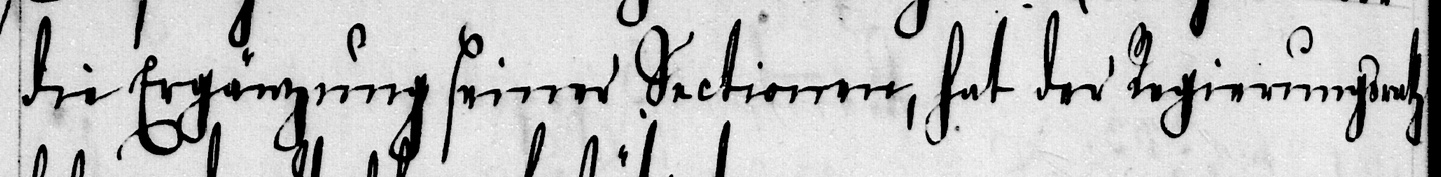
die Ergänzung seiner Sectionen, hat der Regierungsrath
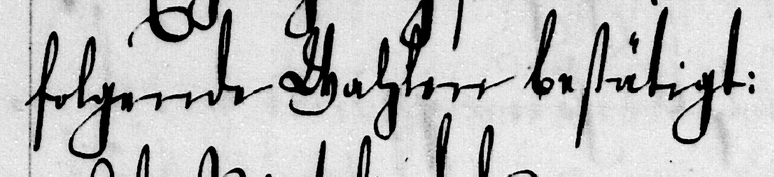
folgende Wahlen bestätigt:
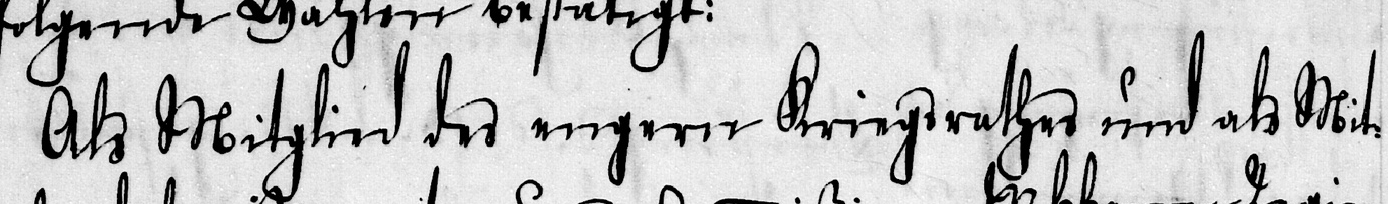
Als Mitglied des engern Kriegsrathes und als Mit¬
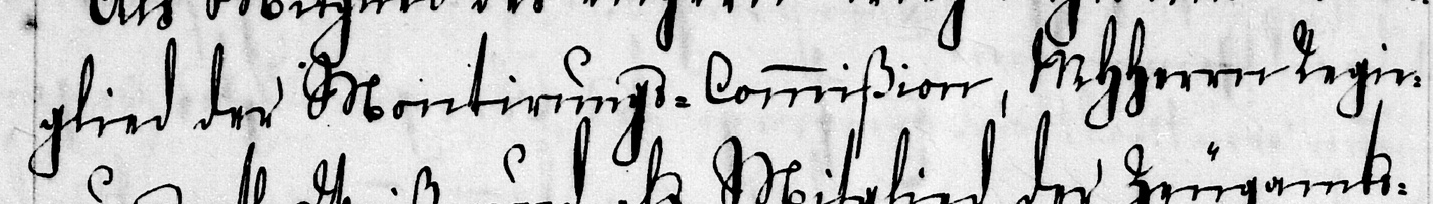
glied der Montirungs-Commißion, MHHerrn Regie¬
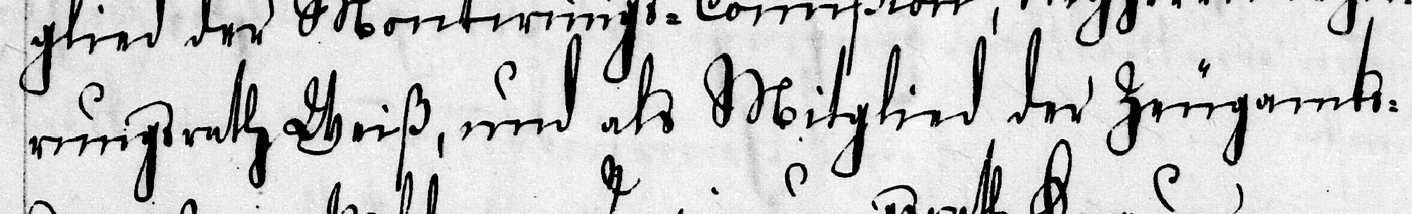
rungsrath Weiß, und als Mitglied der Zeugamt¬
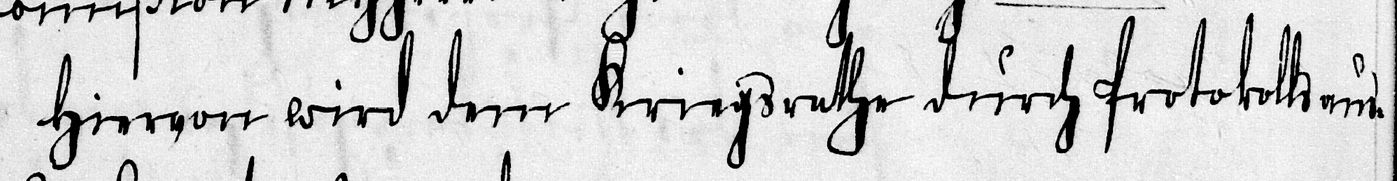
Hiervon wird dem Kriegsrathe durch Protokollsa¬
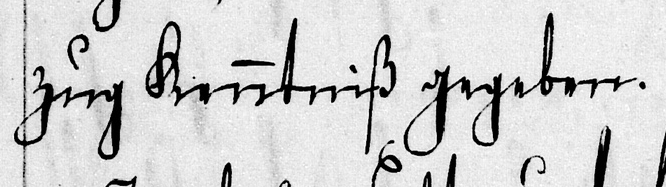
zug Kenntniß gegeben.
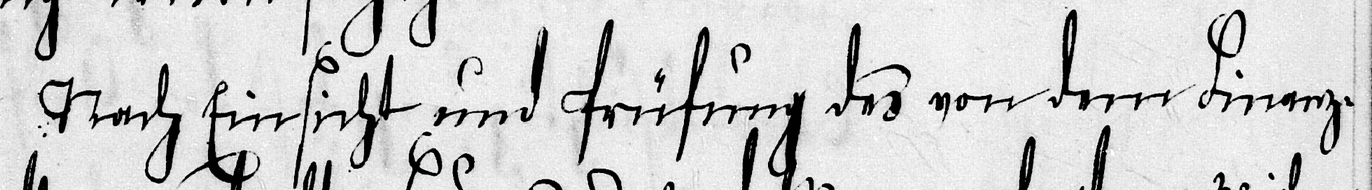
Nach Einsicht und Prüfung des von dem Finanz¬
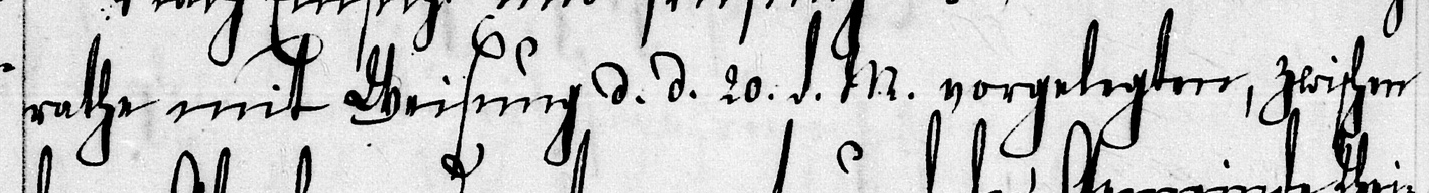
rathe mit Weisung d. d. 20. d. M. vorgelegten, zwischen
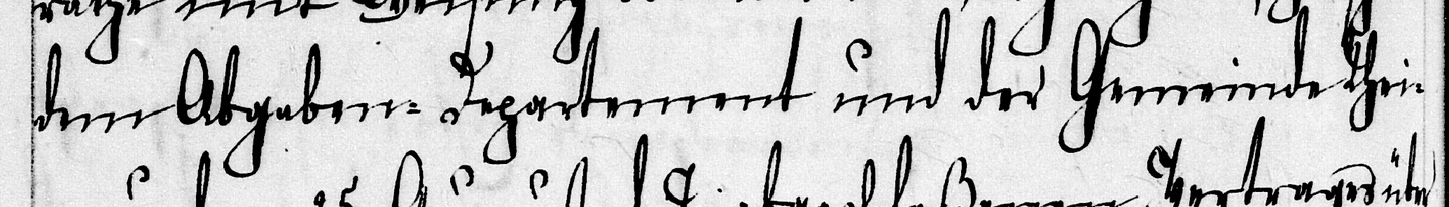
dem Abgaben-Departement und der Gemeinde Rhei¬
